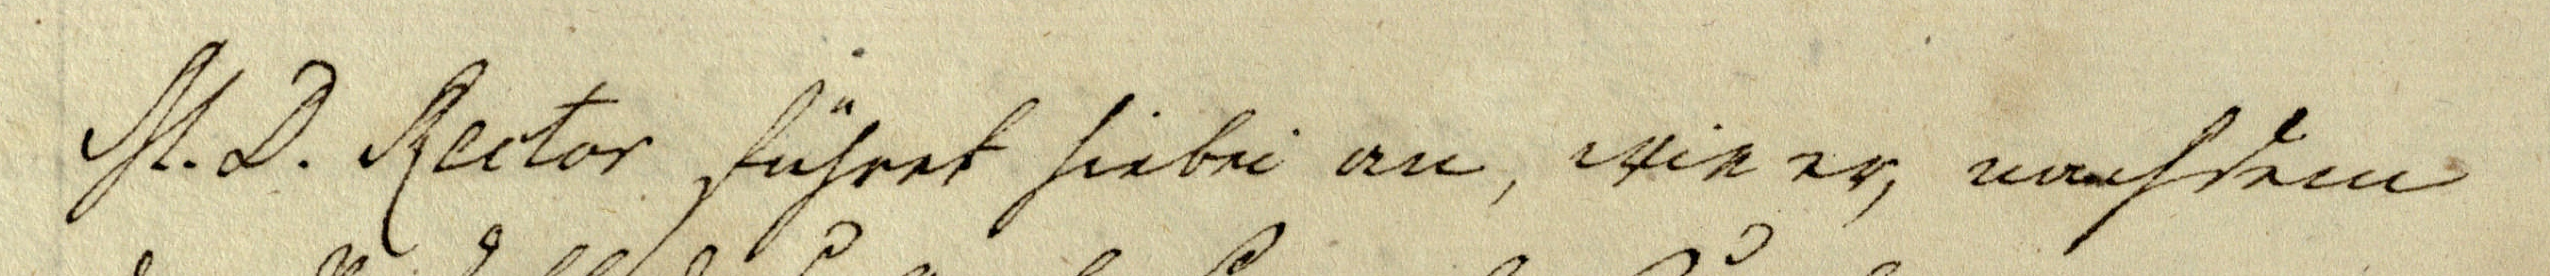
M. D. Rector führet hiebei an, wie er, nachdem
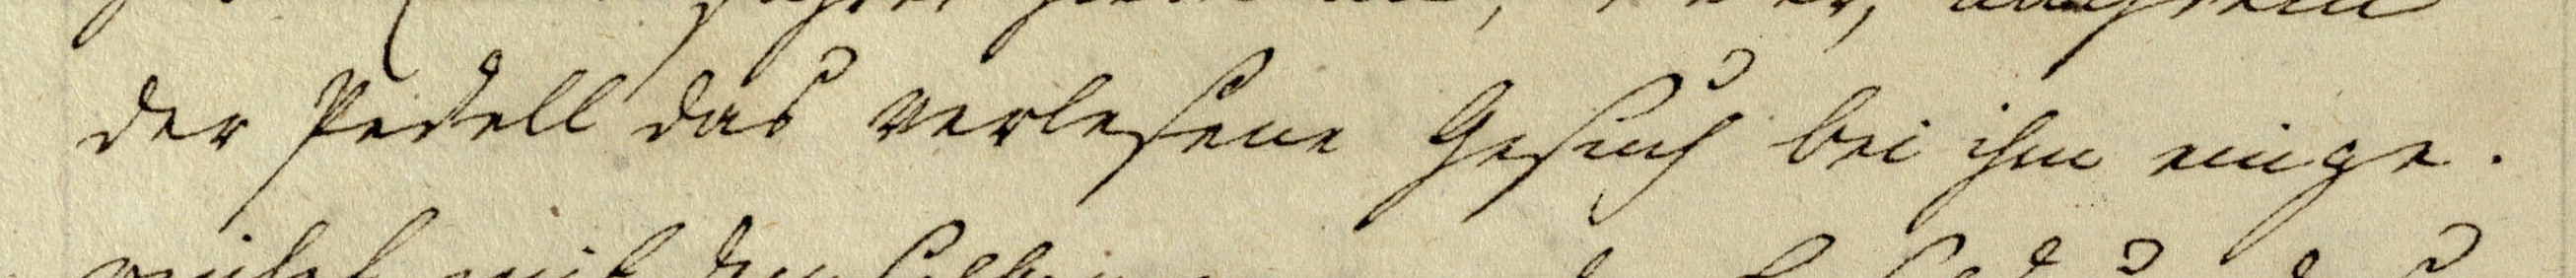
der Pedell das verlesene Gesuch bei ihm einge¬
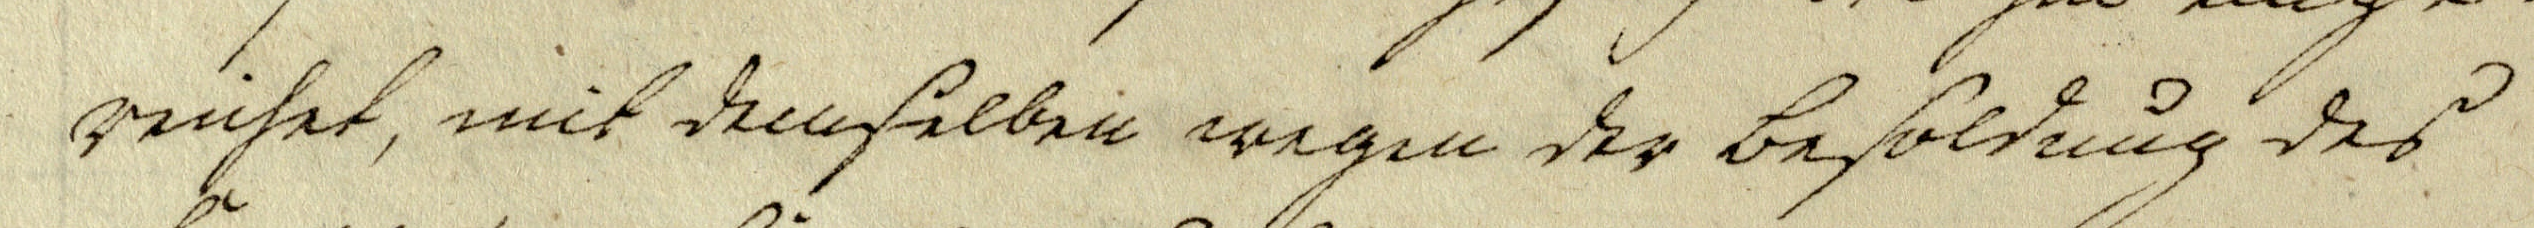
reichet, mit demselben wegen der Besoldung des
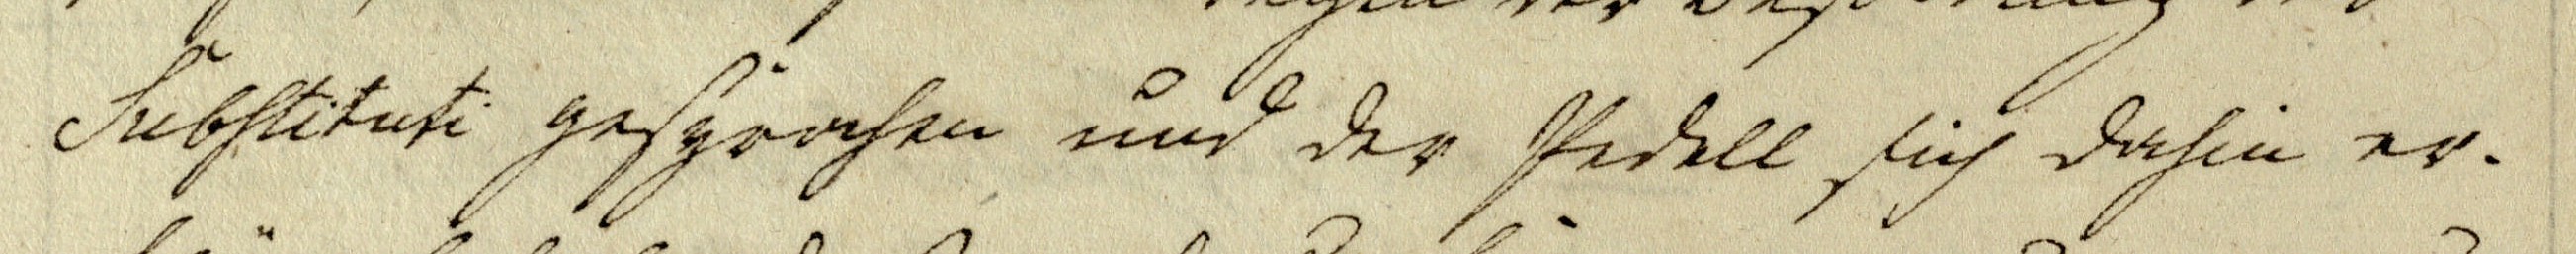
Substituti gesprochen und der Pedell sich dahin er¬
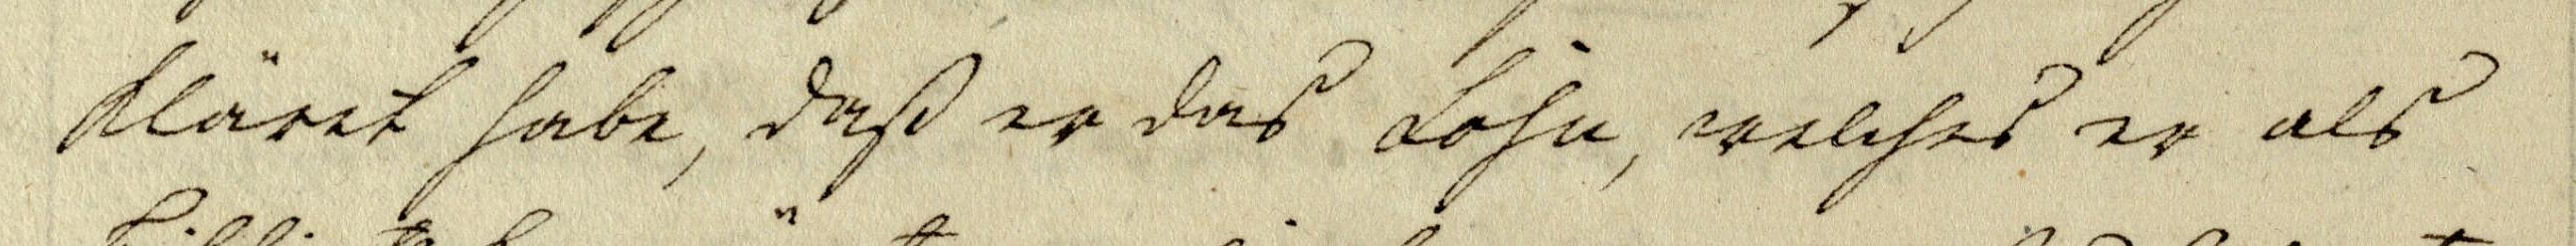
kläret habe, daß er das Lohn, welches er als
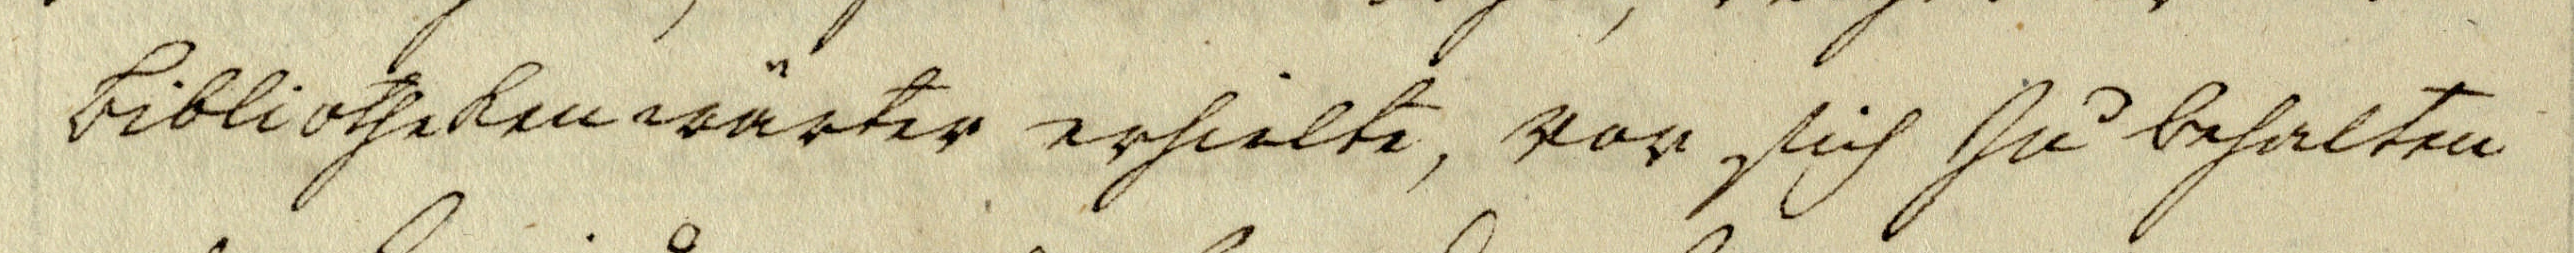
Bibliothekenwärter erhielte, vor sich zu behalten
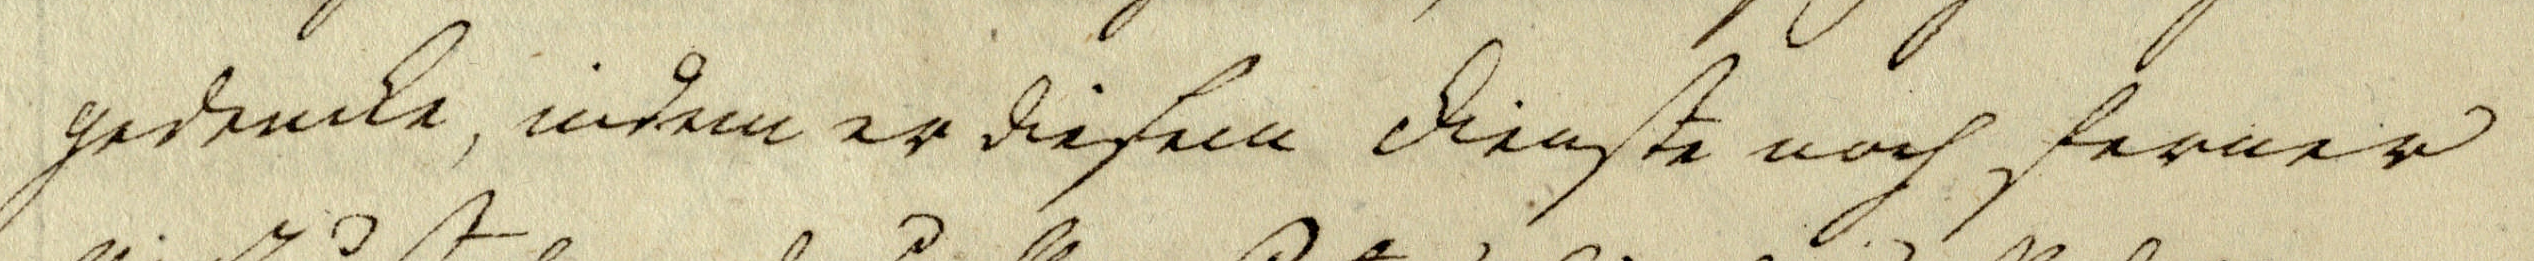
gedencke, indem er diesem Dienste noch ferner
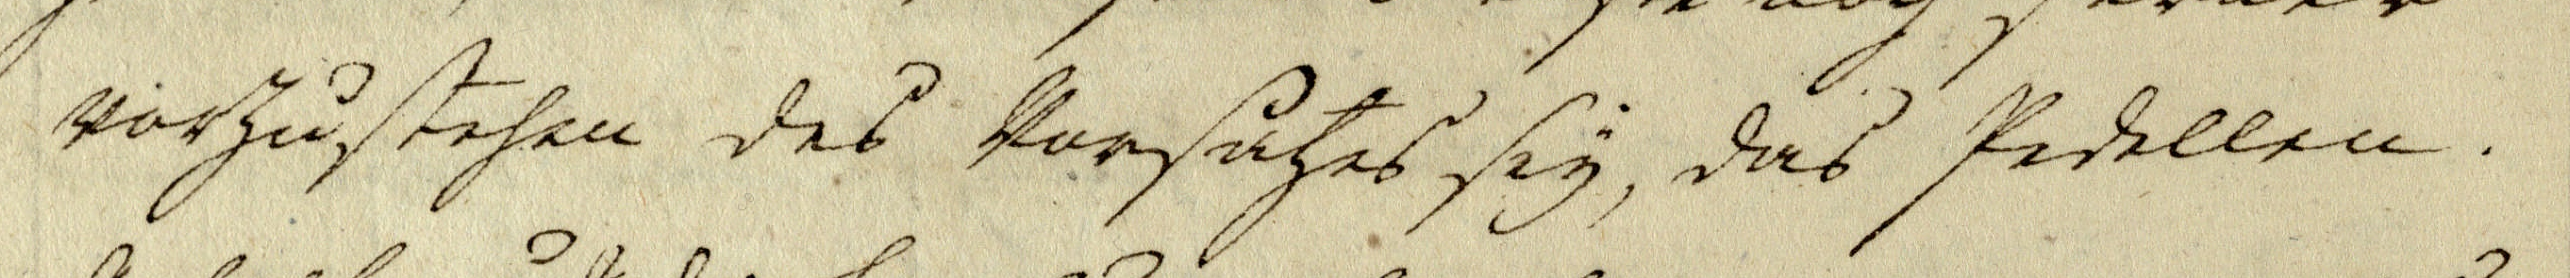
vorzustehen des Vorsatzes seÿ, das Pedellen
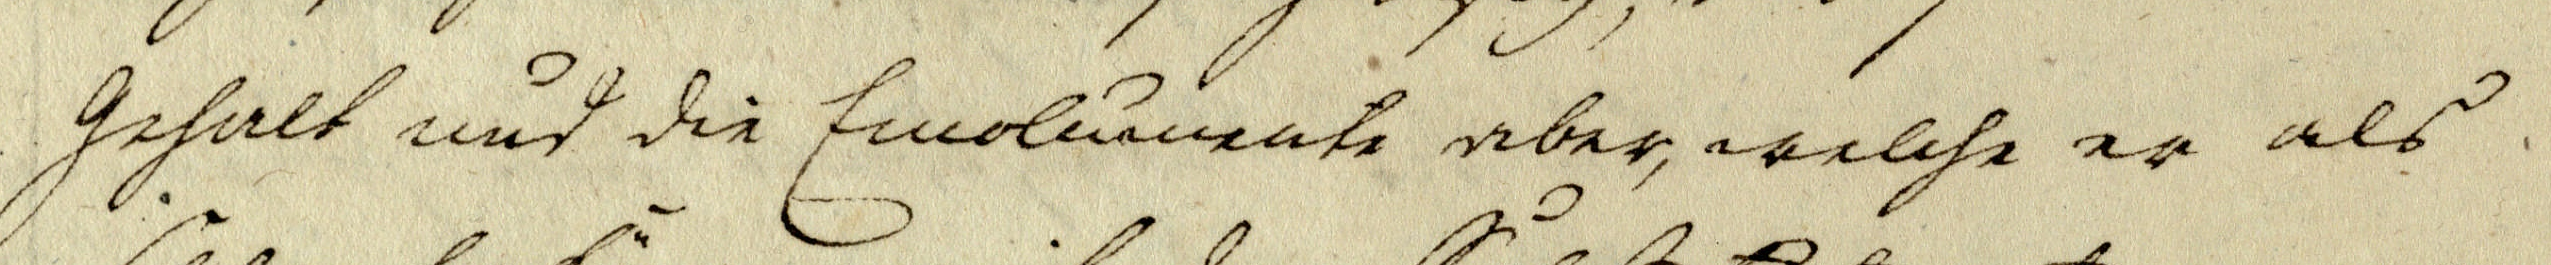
Gehalt und die Emolumente aber, welche er als
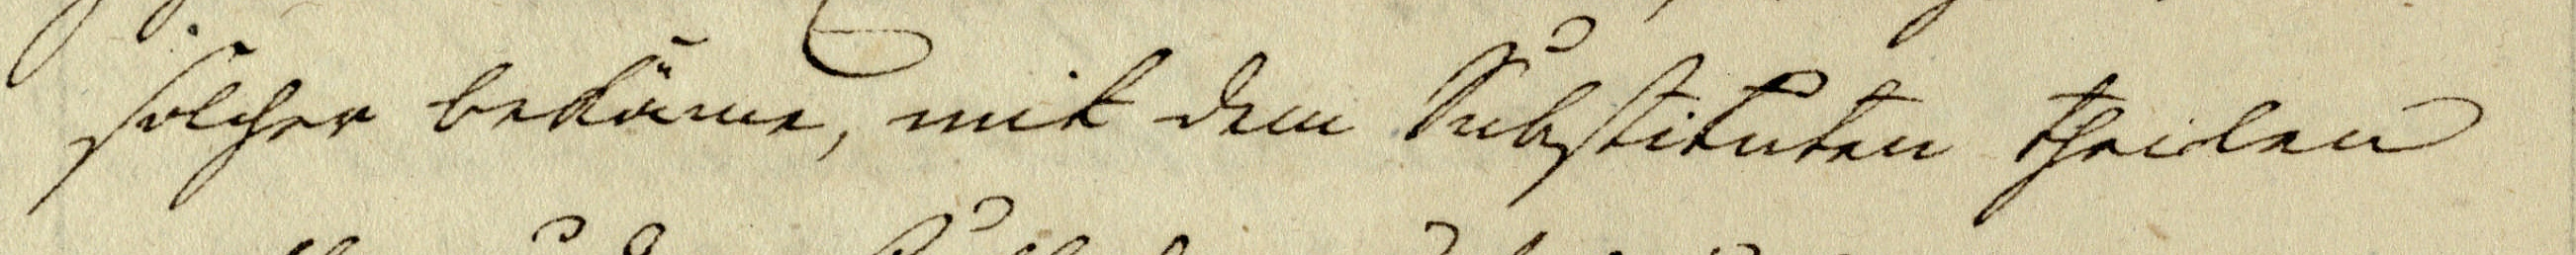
solcher bekäme, mit dem Substituten theilen
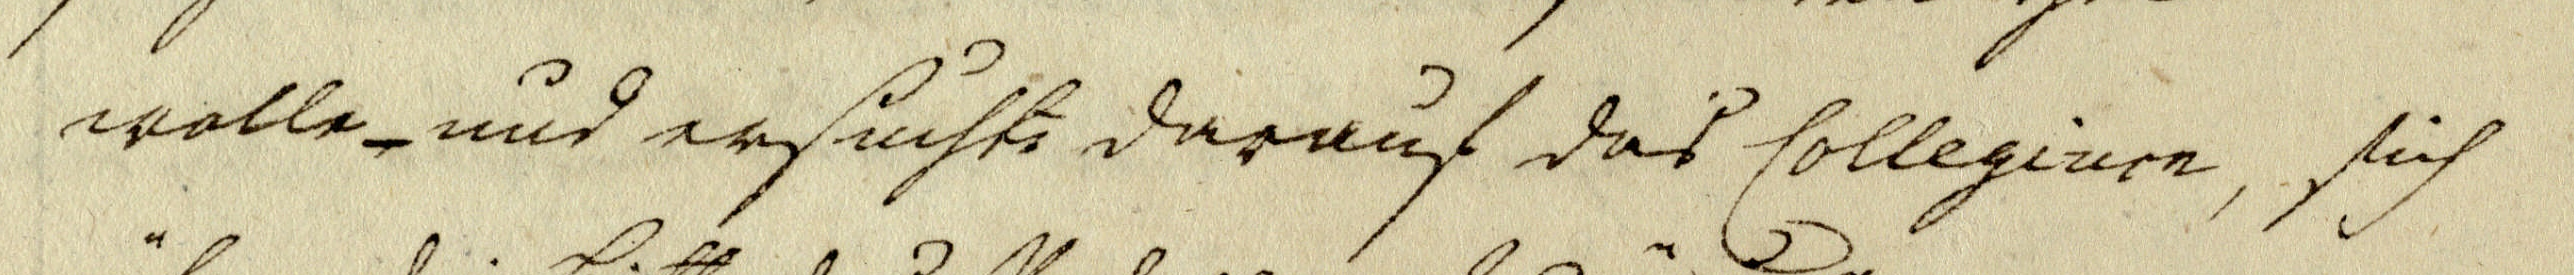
wolle und ersuchte darauf das Collegium, sich
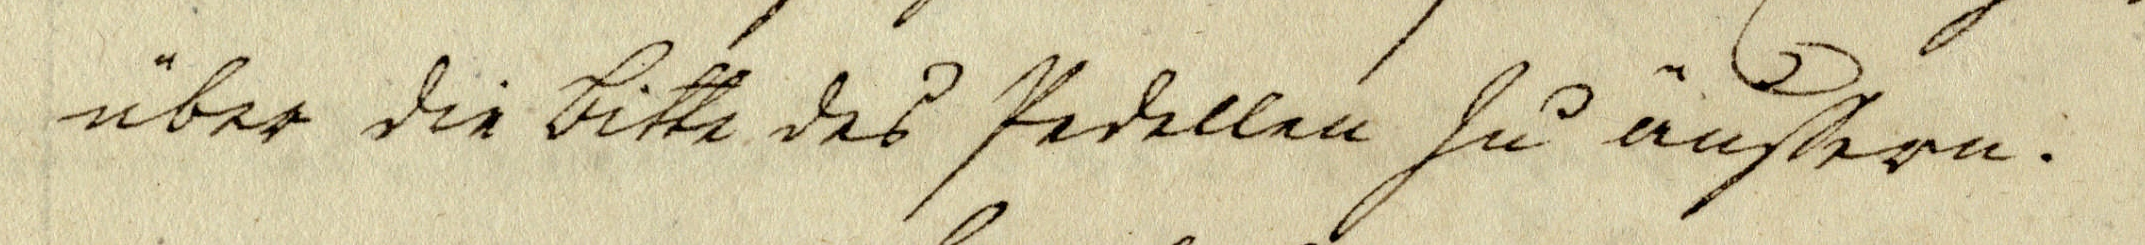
über die Bitte des Pedellen zu äussern.
